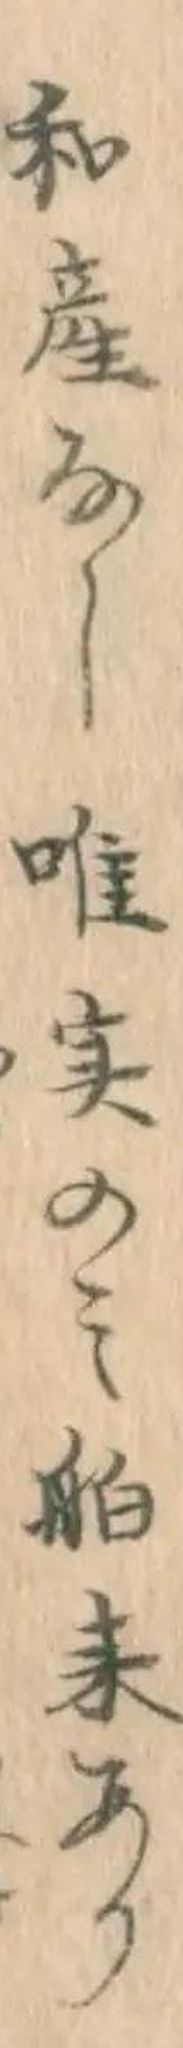和産なし唯実のみ舶来あり
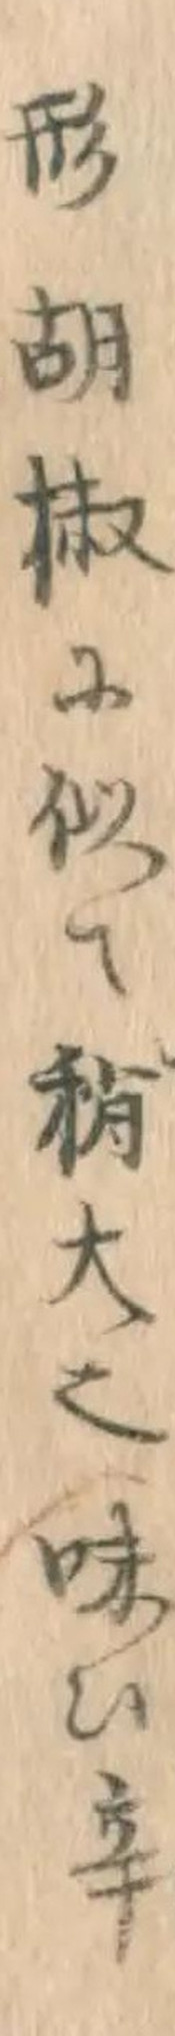形胡椒に似て稍大也味は辛
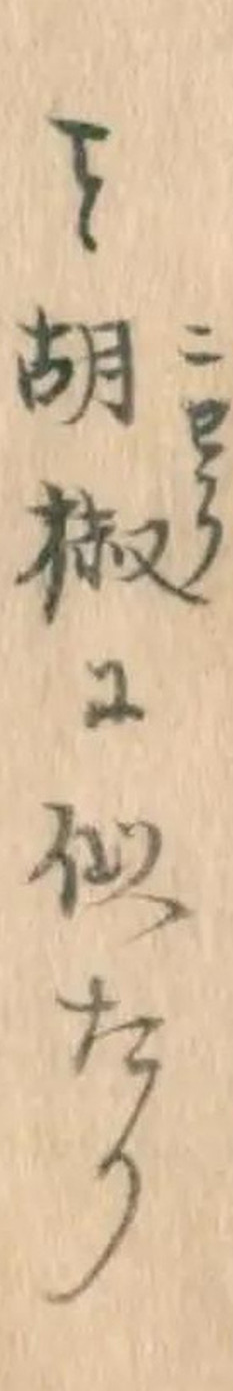こと胡椒に似たり
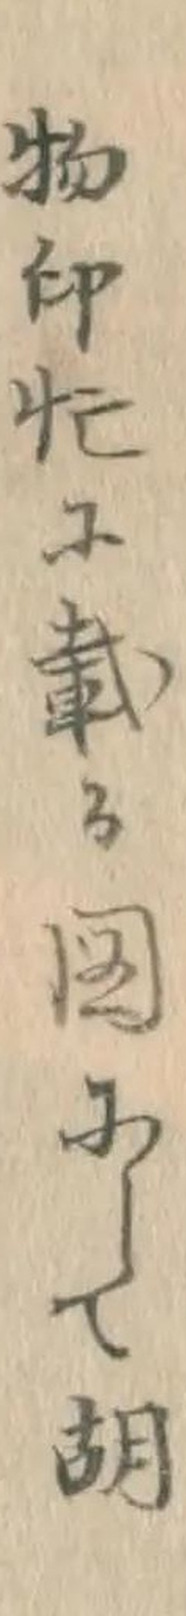物印に載る図にして胡
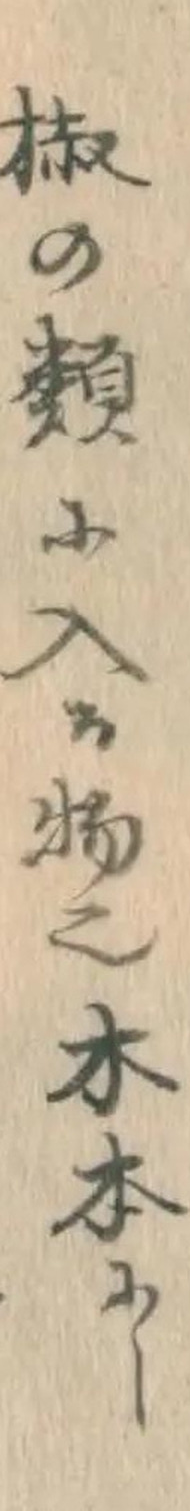椒の類に入る物也木本にし
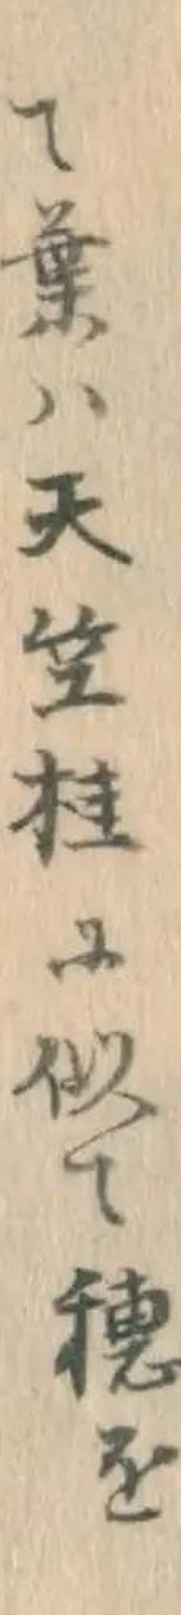て葉は天竺桂に似て穂を
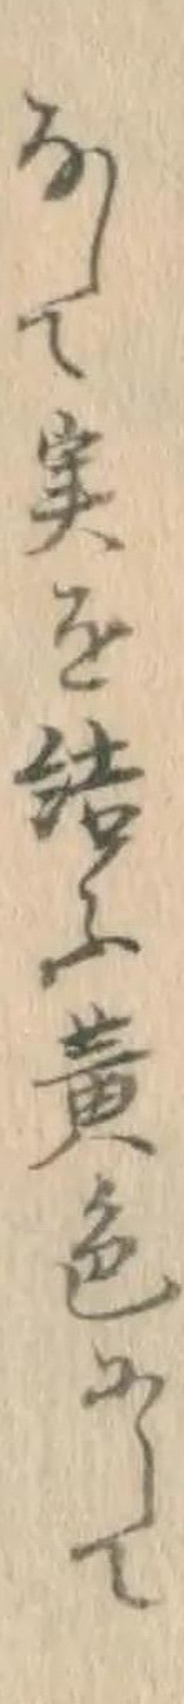なして実を結ふ黄色にして
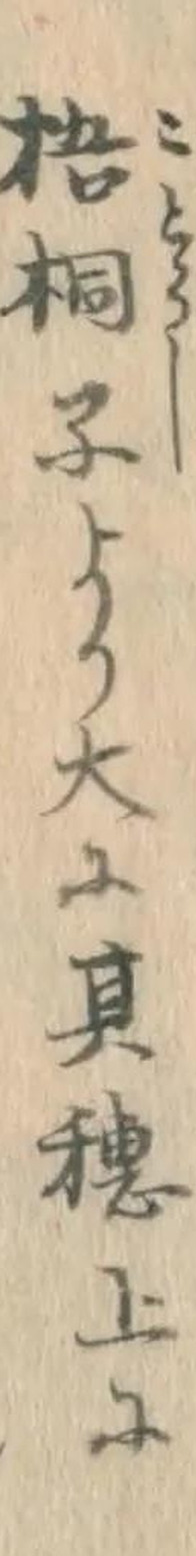梧桐子より大に其穂上に
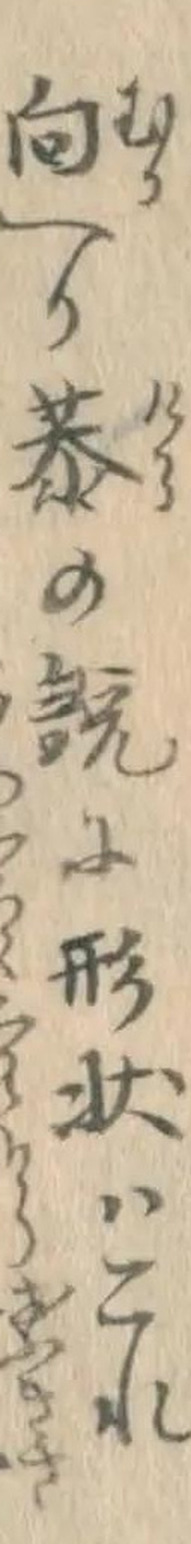向へり恭の説に形状はこれ
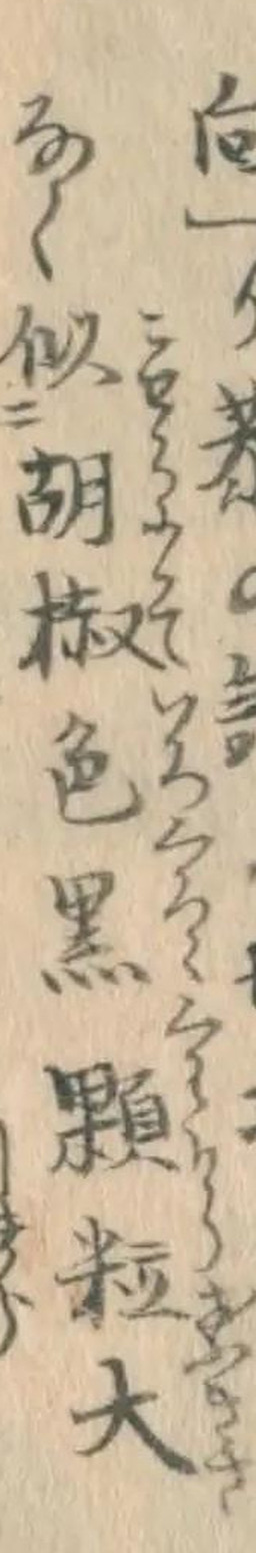なく似胡椒色黒顆粒大
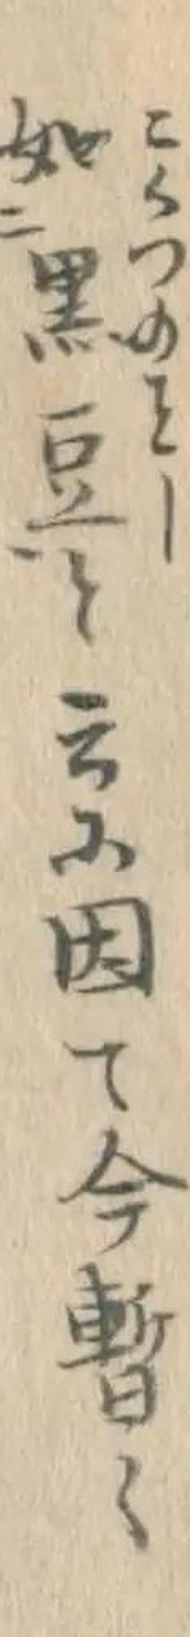如黒豆と云ふ因て今暫く

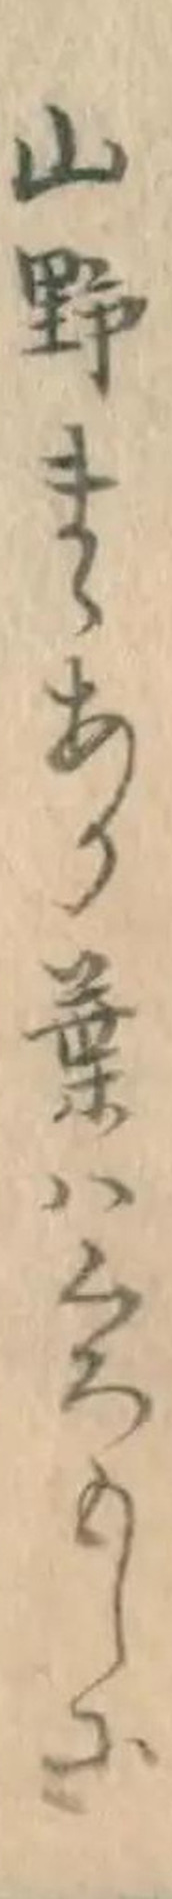山野まゝあり葉はくろもしに
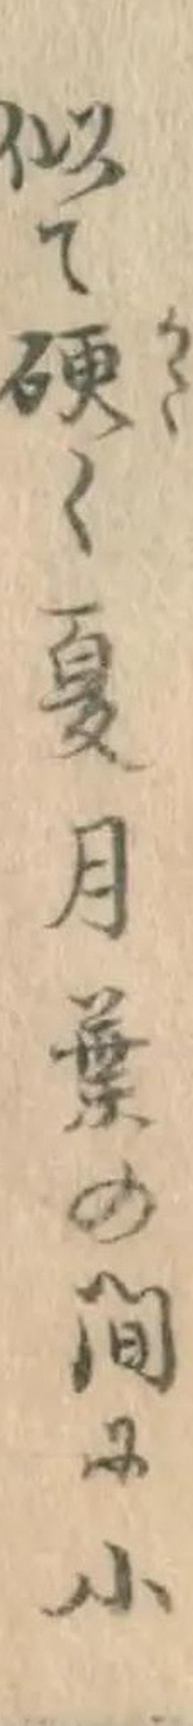似て硬く夏月葉の間に小
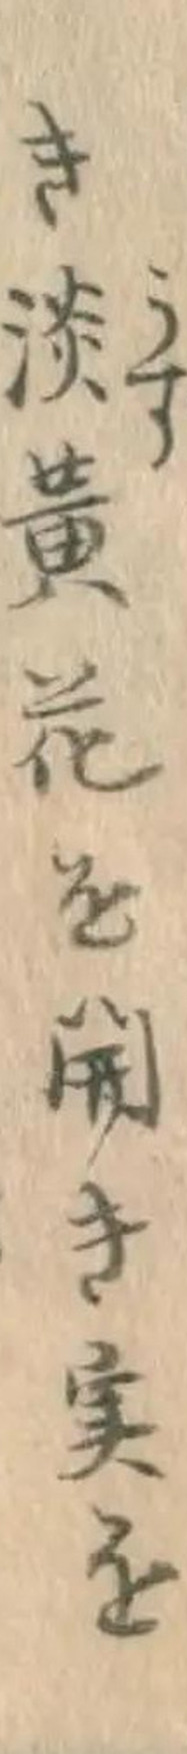き淡黄花を開き実を
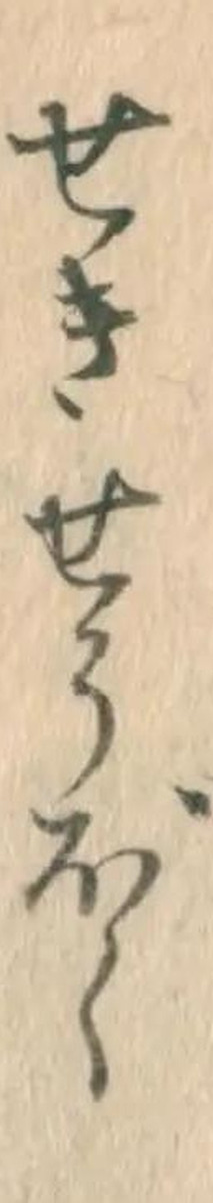せきせうぼく
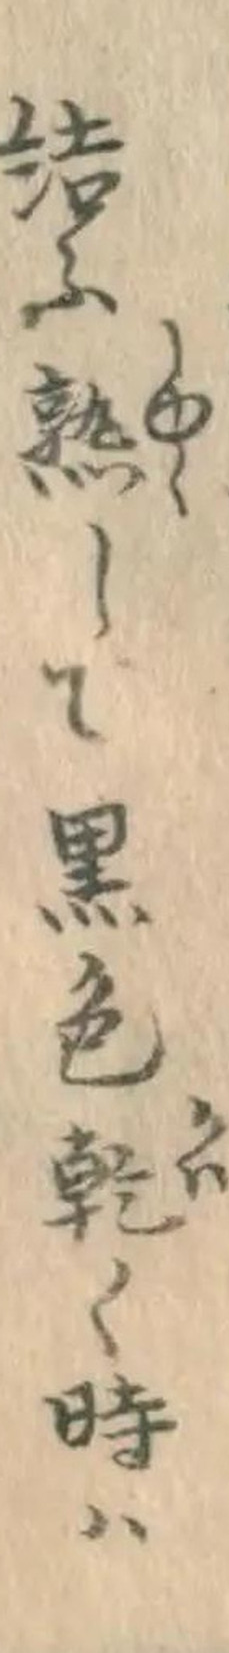結ふ熟して黒色乾く時は
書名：本草図譜. 巻70-72
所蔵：国立国会図書館 National Diet Library, JAPAN
